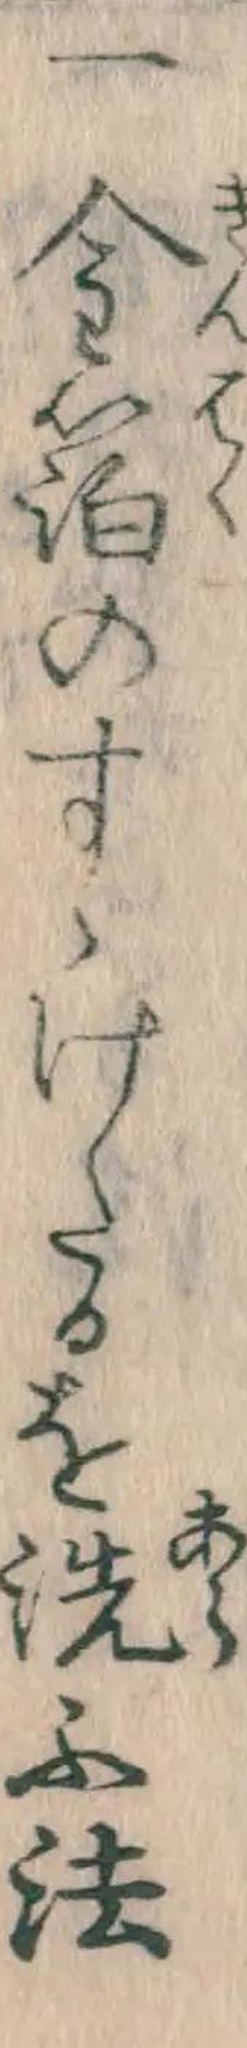一金箔のすゝけたるを洗ふ法
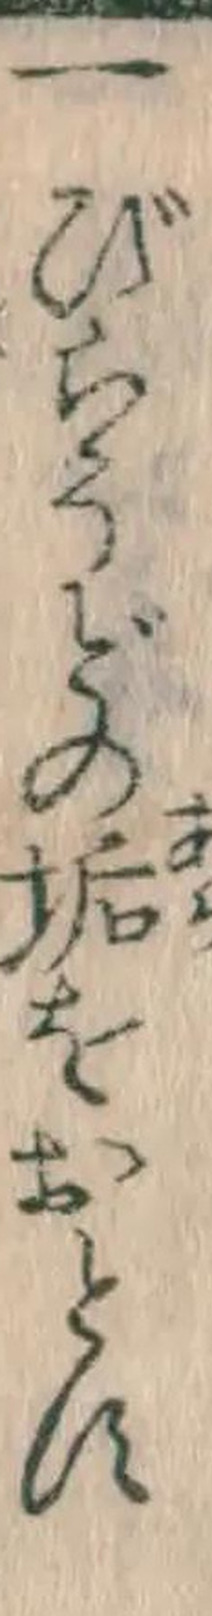一びらうどの垢をおとす
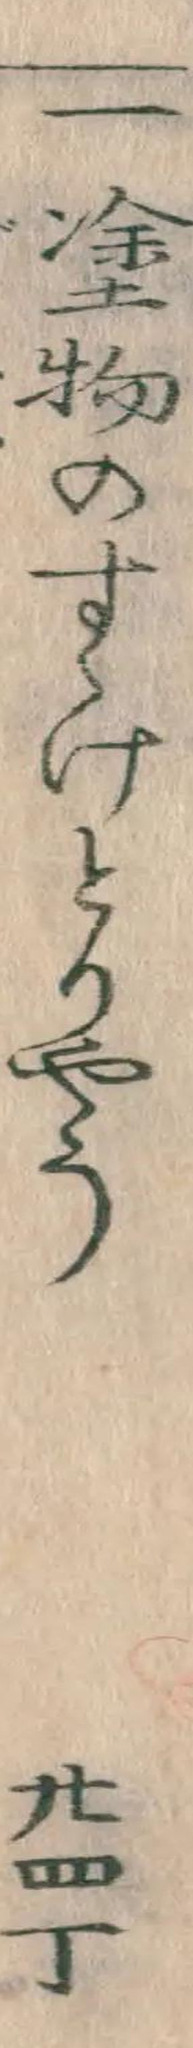一塗物のすゝけとりやう廿四丁
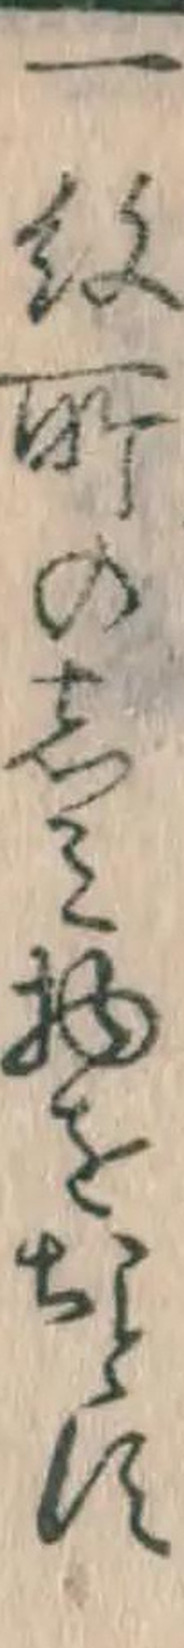一紋所のしみ物をおとす
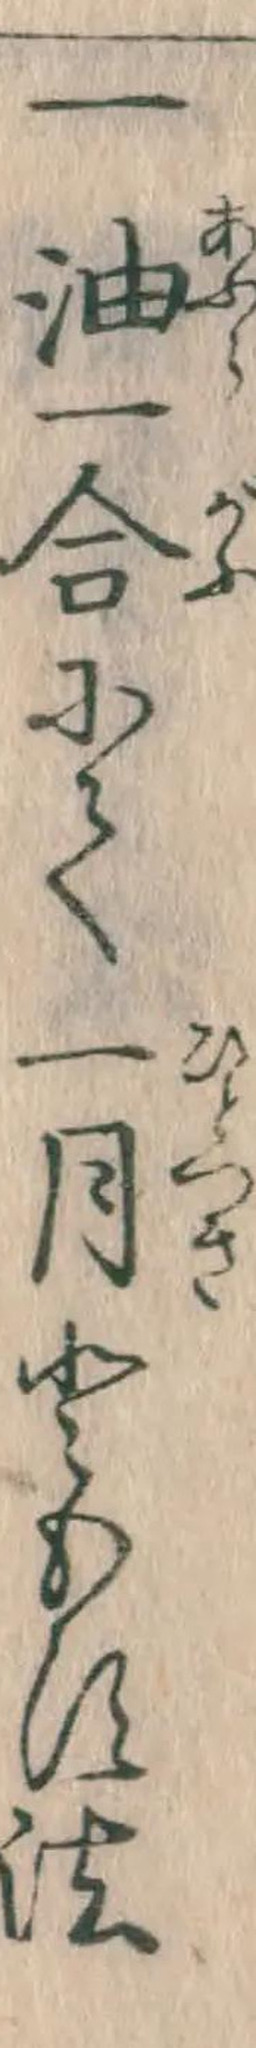一油一合にて一月ともす法
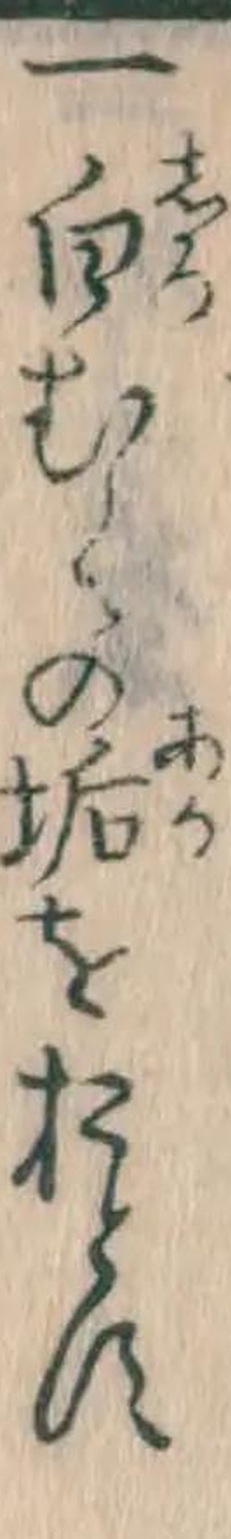一白むくの垢をおとす
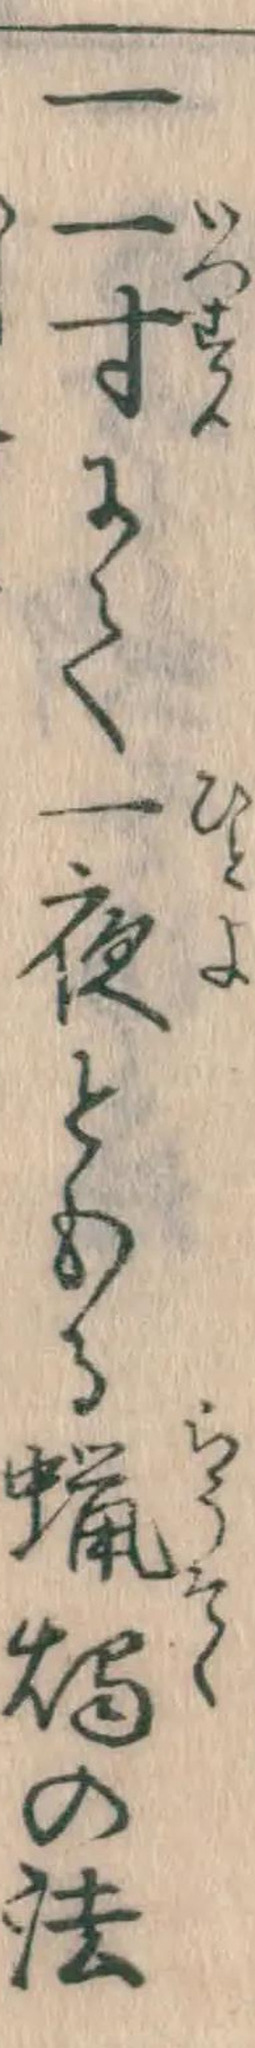一一寸にて一夜ともる蠟燭の法
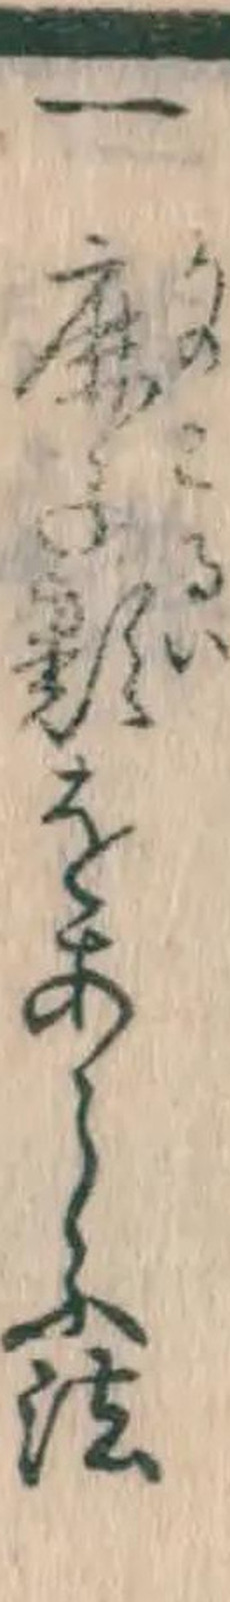一鹿子類をあらふ法
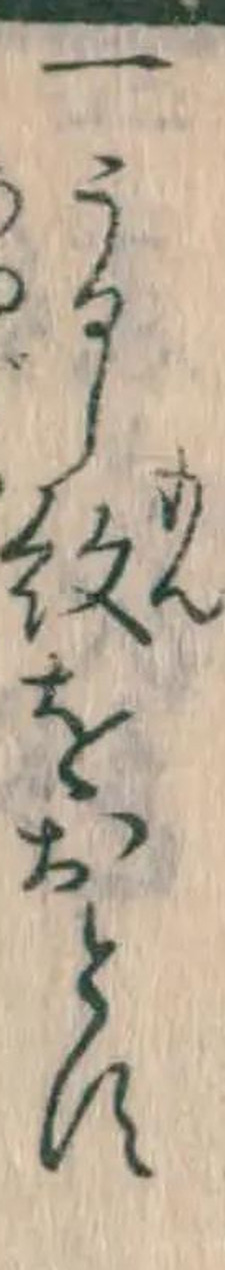一うるし紋をおとす
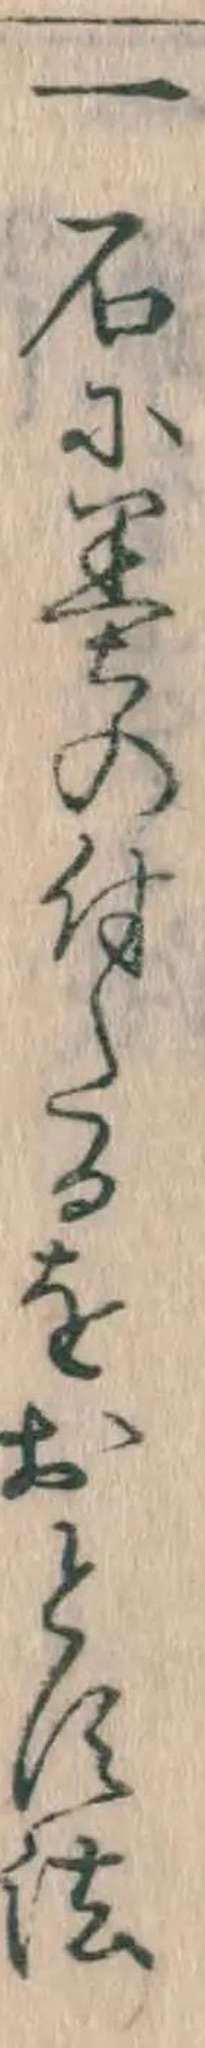一石に墨の付たるをおとす法
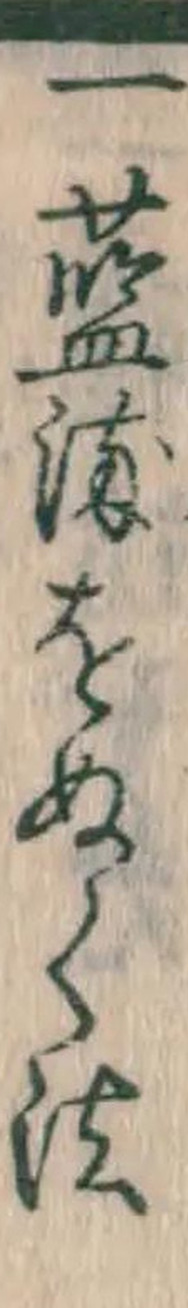一藍染をぬく法
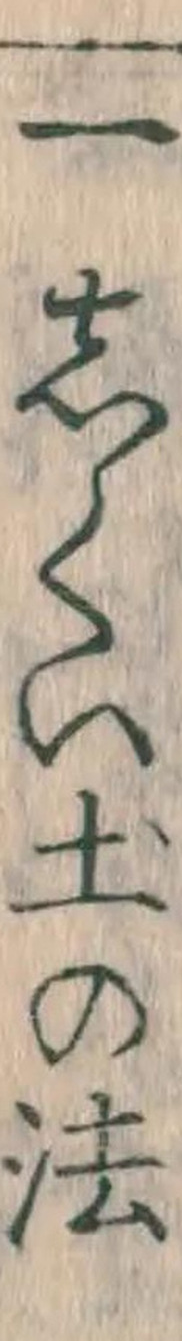一しくい土の法
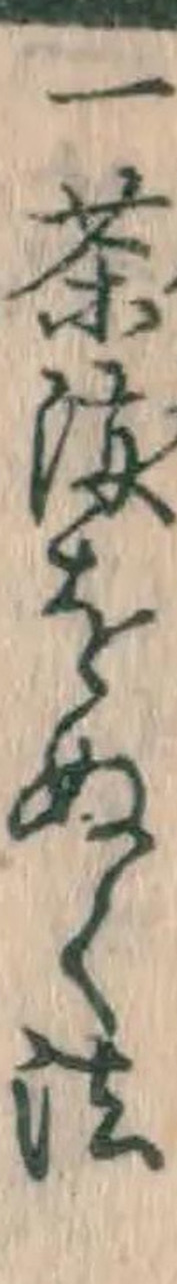一藍染をぬく法
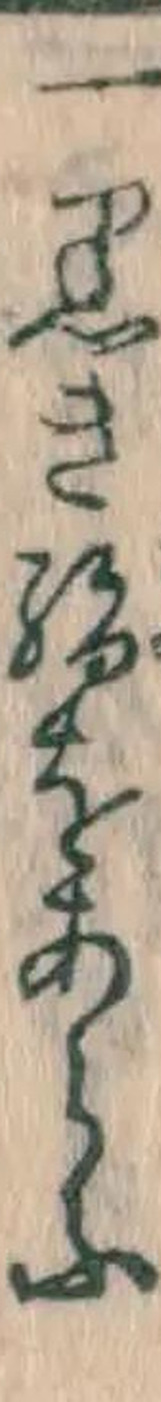一黒き絹をあらふ
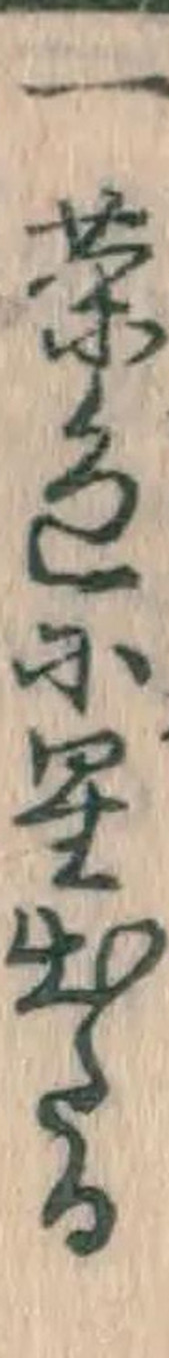一茶色に星出たる
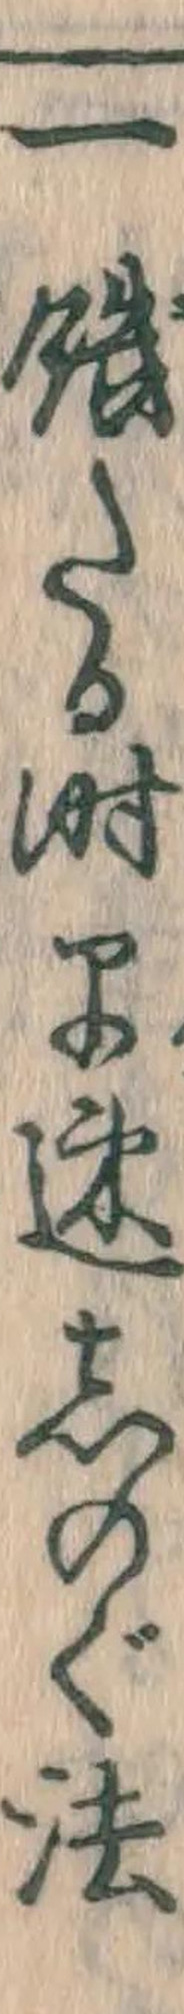一饑たる時早速しのぐ法
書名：広益秘事大全 3巻. [1]
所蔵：国立国会図書館 National Diet Library, JAPAN
